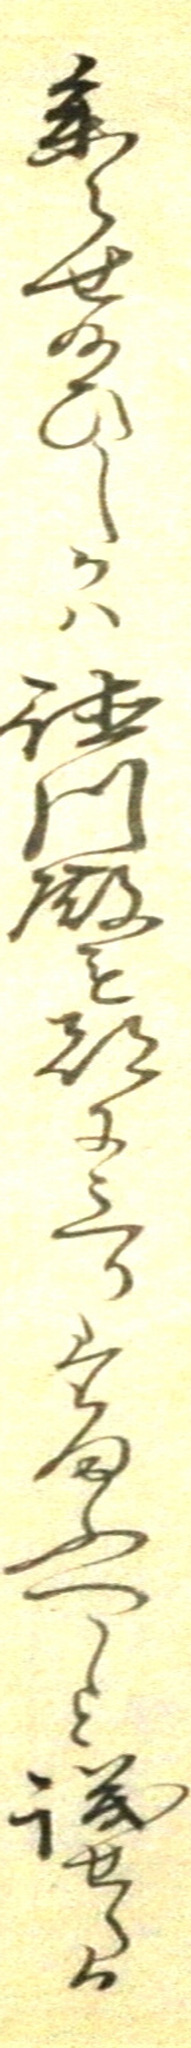参らせ給ひしかは徳川殿も都に上りたまふへしと議せらる
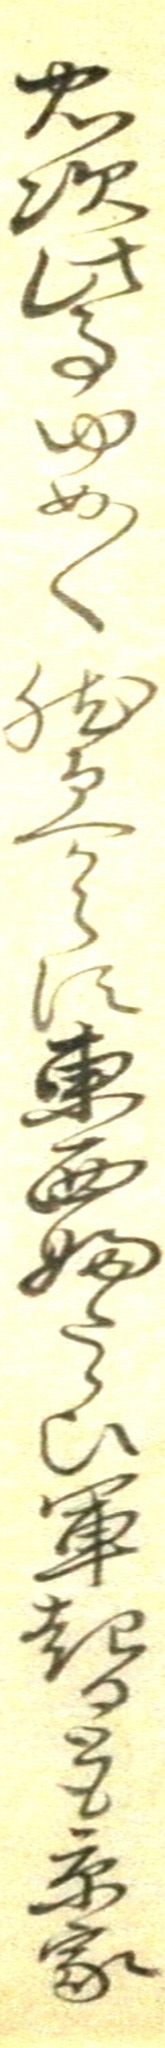忠次此事ゆめ〳〵然るへからす東西ふたゝひ軍起るとも京家
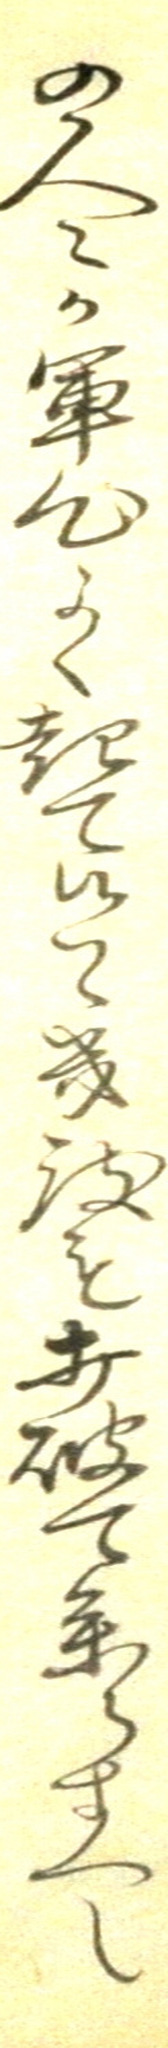の人々か軍心よく起て候はゝ幾度も打破て参らすへし
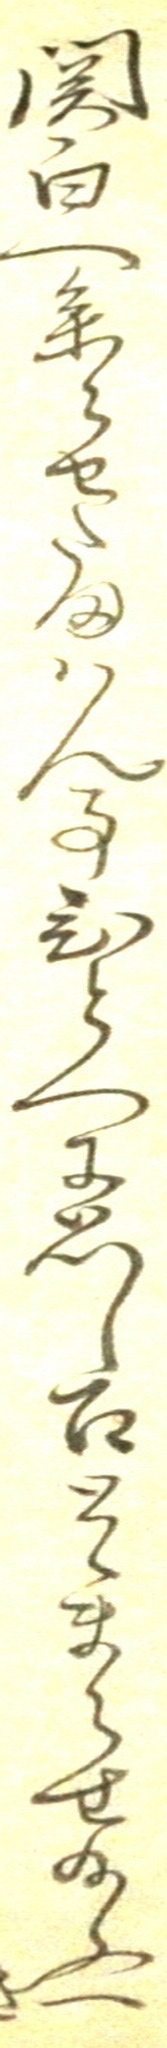関白へ参らせたまはん事ひとつに思し召とゝまらせ給ふへき
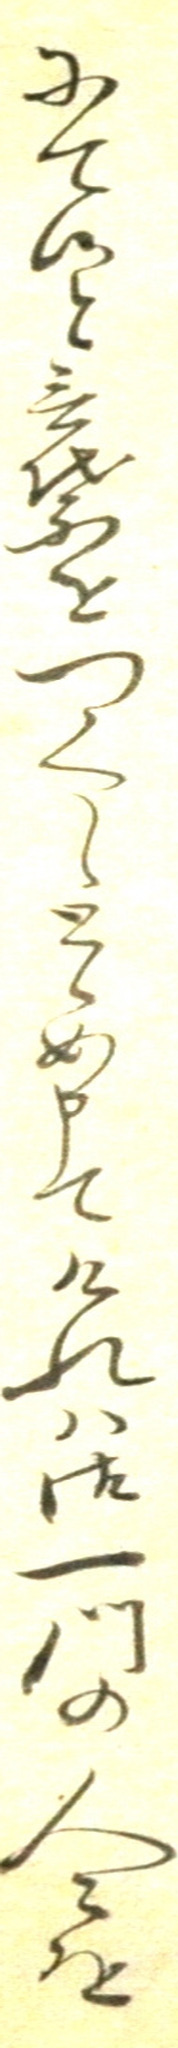にて候と言葉をつくしとゝめ申てけれは御一門の人々を
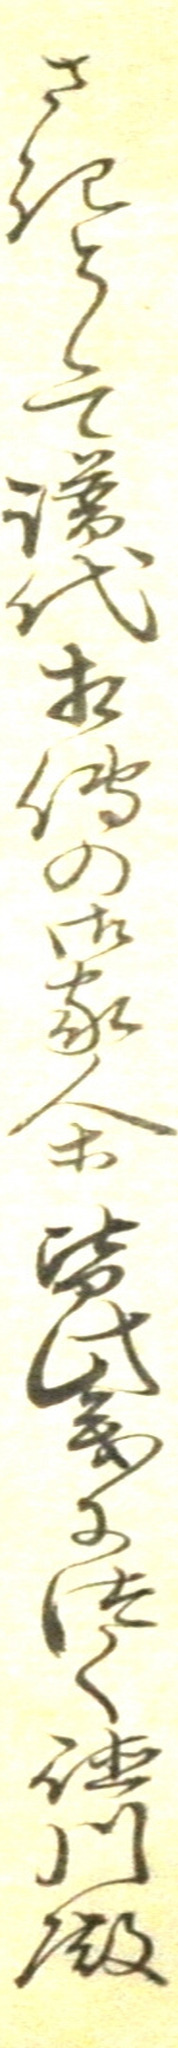さきとして普代相伝の御家人等皆此羲につく徳川殿
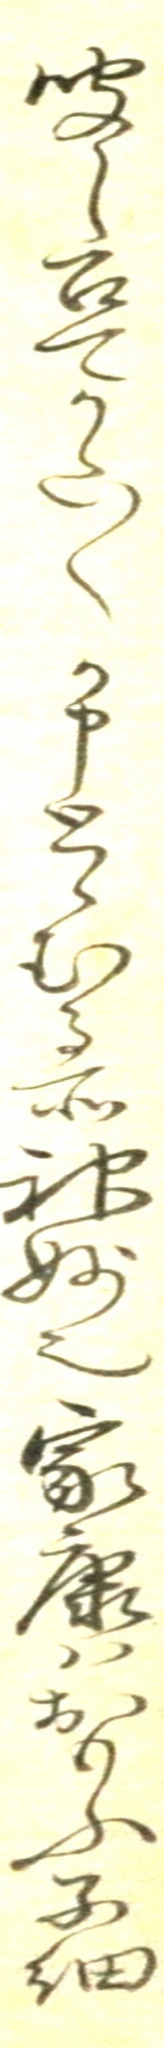聞し召てかた〳〵か申とゝむる所神妙也家康はおもふ子細
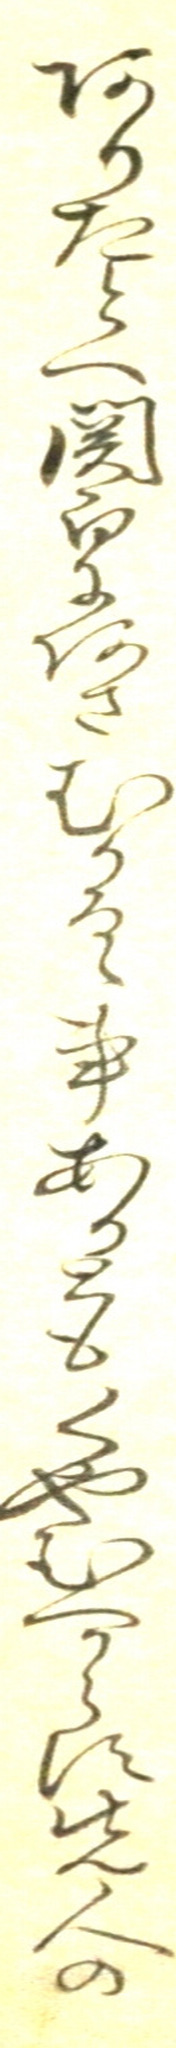ありたとへ関白にあさむかるゝ事あるともくやむへからす先人の
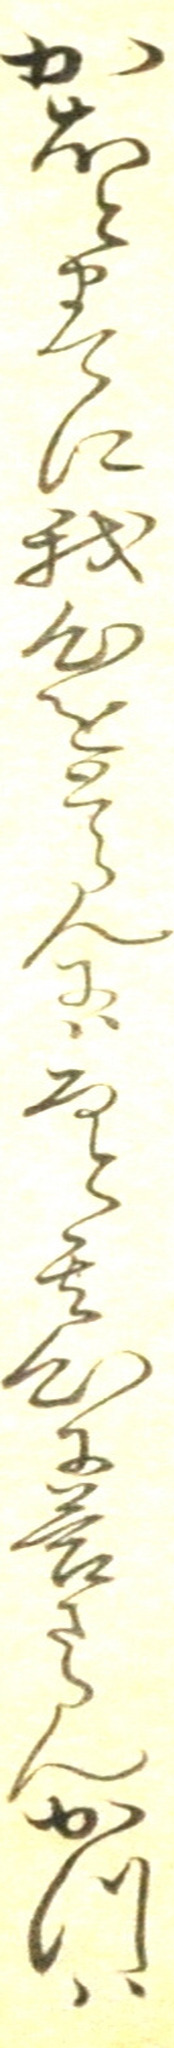かほとまてに我心をとらんにはなと其心に答さらんかつは
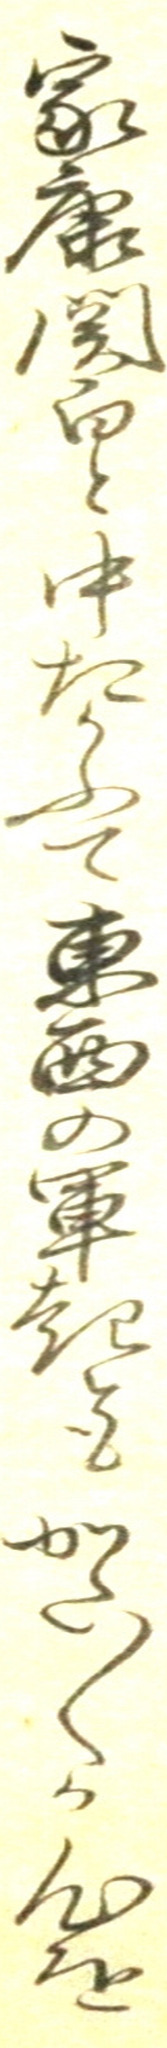家康関白と中たかふて東西の軍起ともかた〳〵か心を
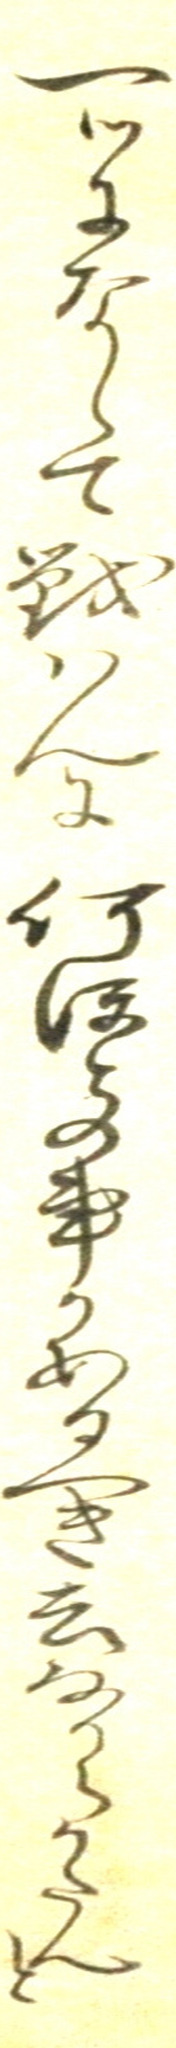一ツになして戦はんに何ほとの事かあるへき去なからかたんと
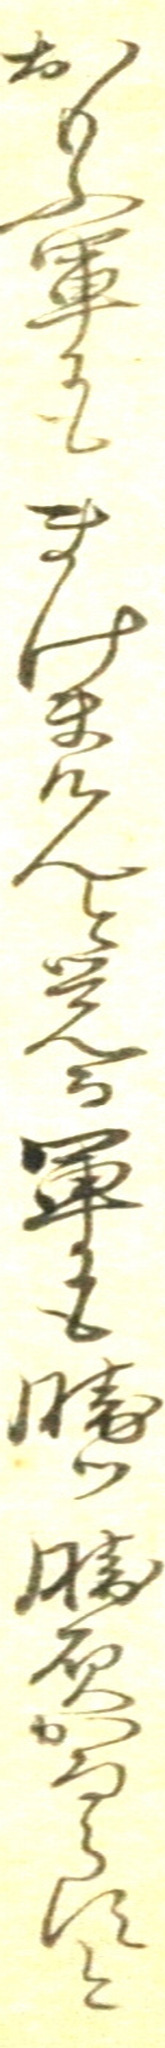おもふ軍にもまけまけんと覚る軍にも勝ツ勝負かならすと
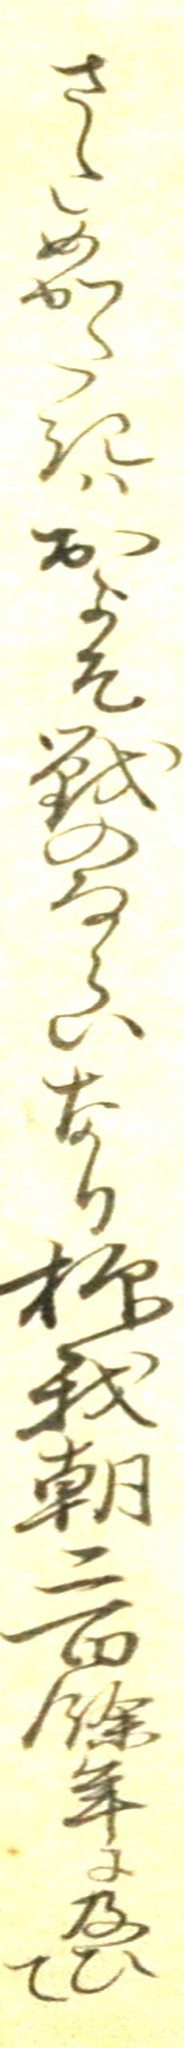さためかたきはおよそ戦のならいなり抑我朝二百余年に及ひて
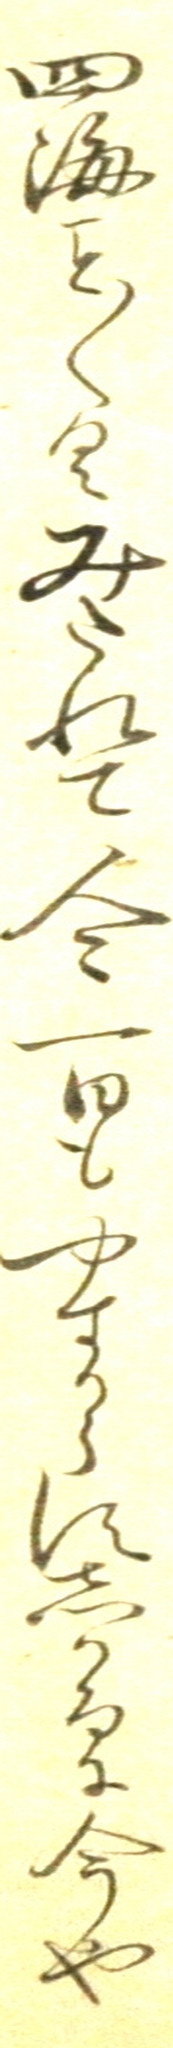四海こと〳〵くみたれて人々一日もやすからすしかるに今や
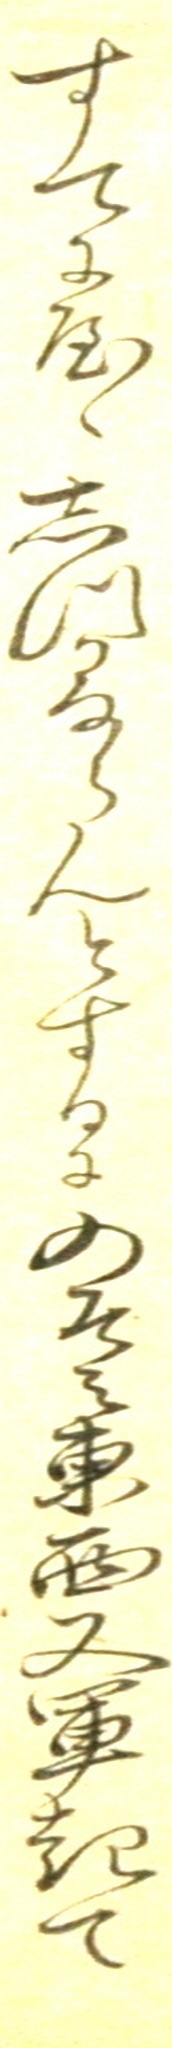すてにやゝしつかならんとするにのそみ東西又軍起て
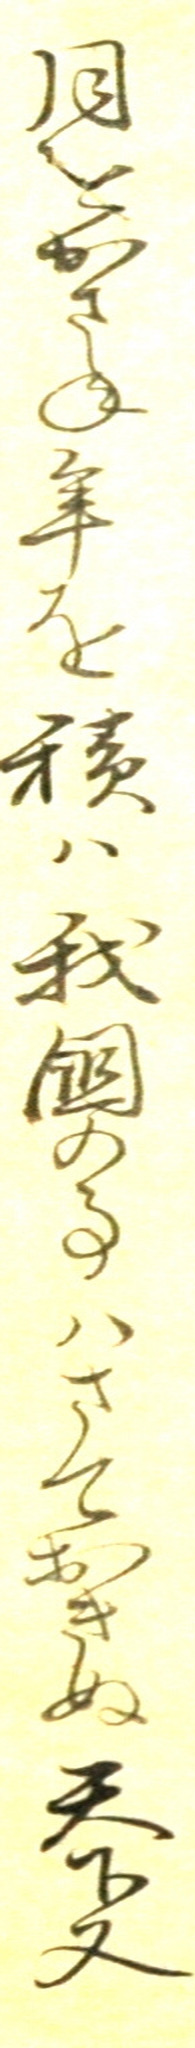月をかさね年を積は我国の事はさておきぬ天下又
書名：藩翰譜（四・上）
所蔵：伊那市立高遠町図書館・合同会社AMANE
